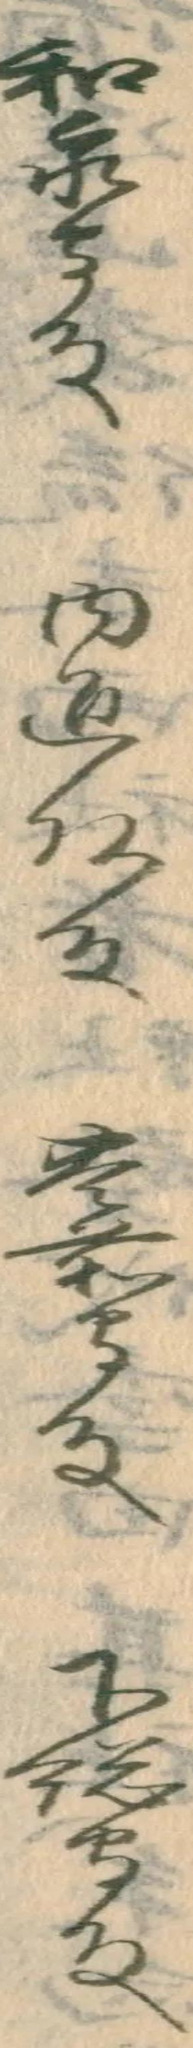和泉守殿内匠頭殿豊前守殿下総守殿
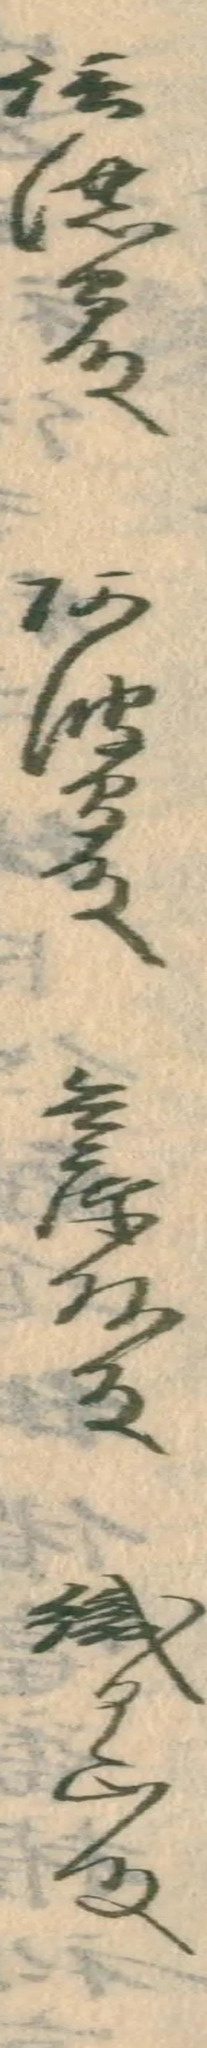信濃守殿阿波守殿兵庫頭殿織部正殿
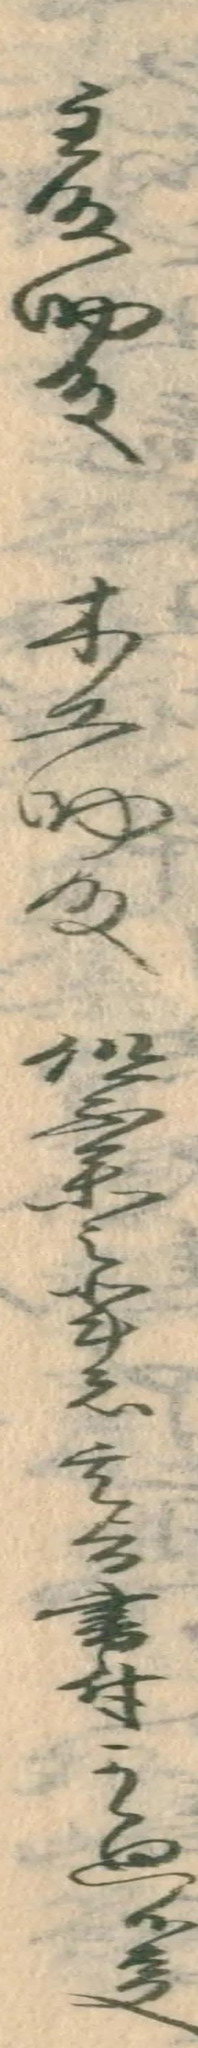主殿助殿木工助殿但不参之輩者其旨書付可廻候事
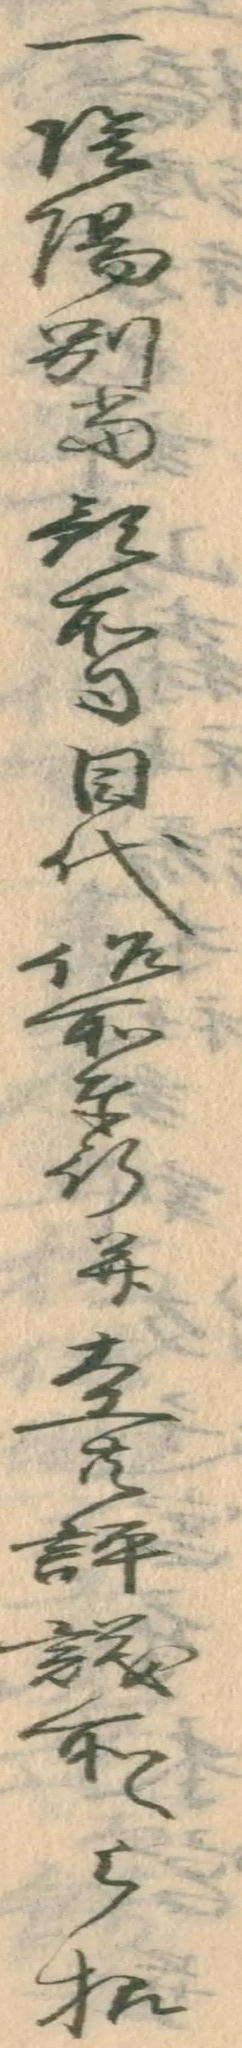一陰陽別当預所司目代作所奉行并大工共評議所へ被招
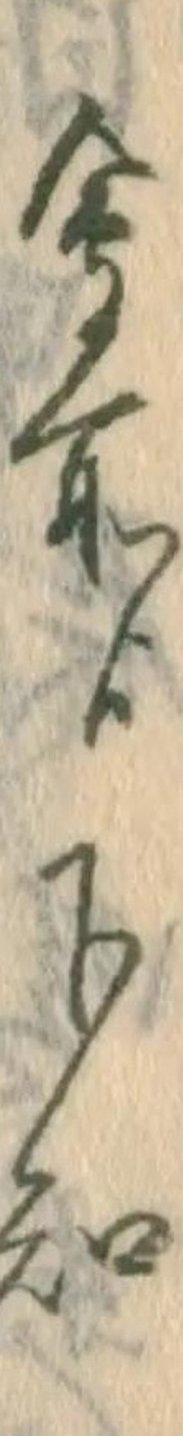会所ゟ下知
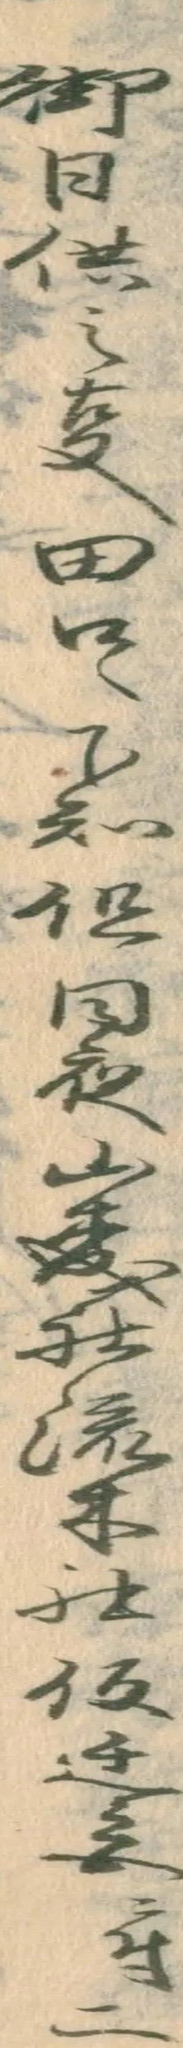一御日供之事田口へ下知但同夜山森社流木社仮迁宮ニ付二
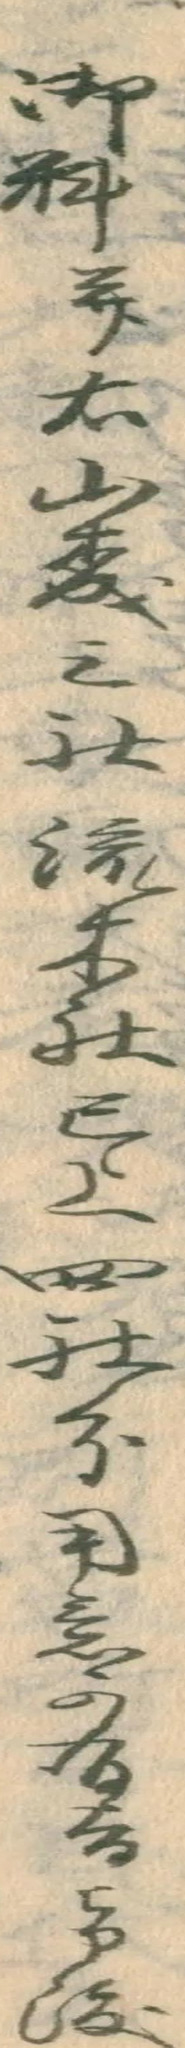御料并右山森三社流木社已上四社分用意可有旨被申渡
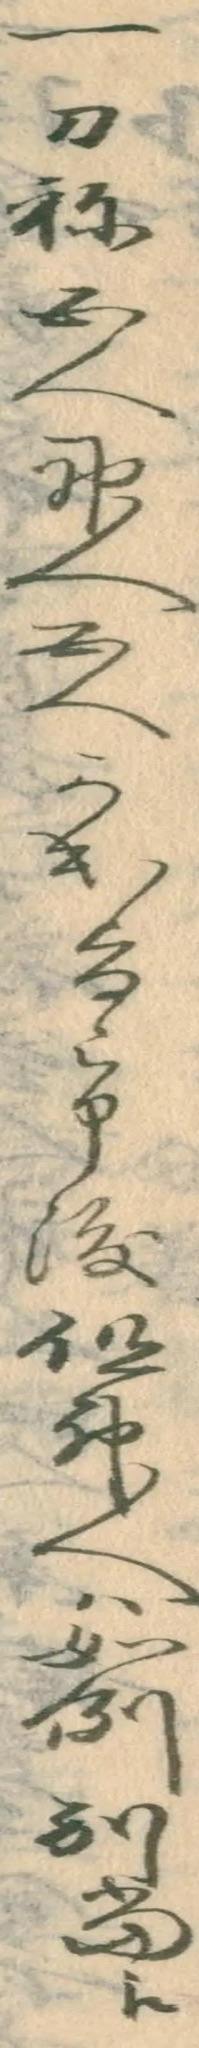一刀祢五人神人五人可出旨被申渡但神人ハ如例別当江
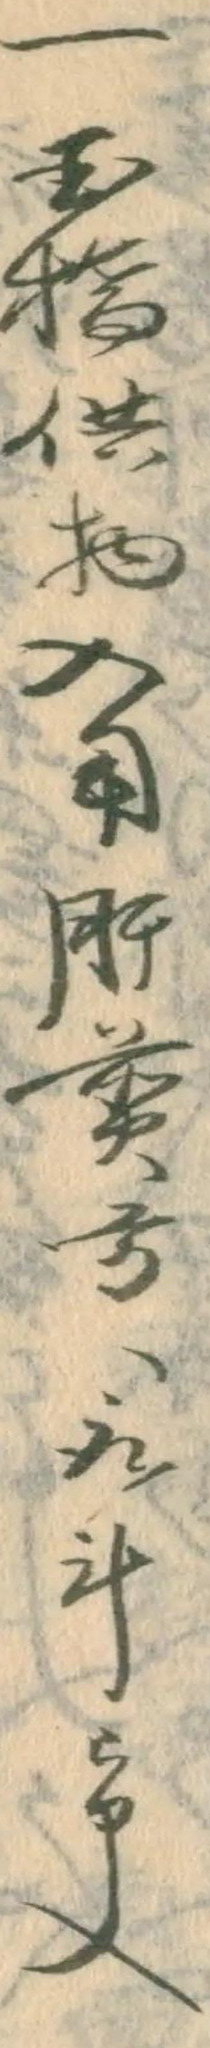一玉橋供物入用肝煎方へ取計被申入
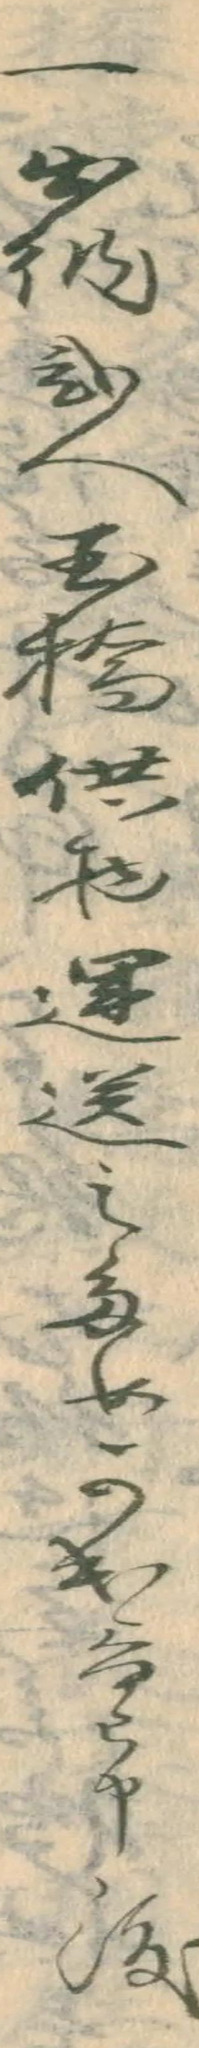一出納弐人玉橋供物運送之ため可出旨被申渡
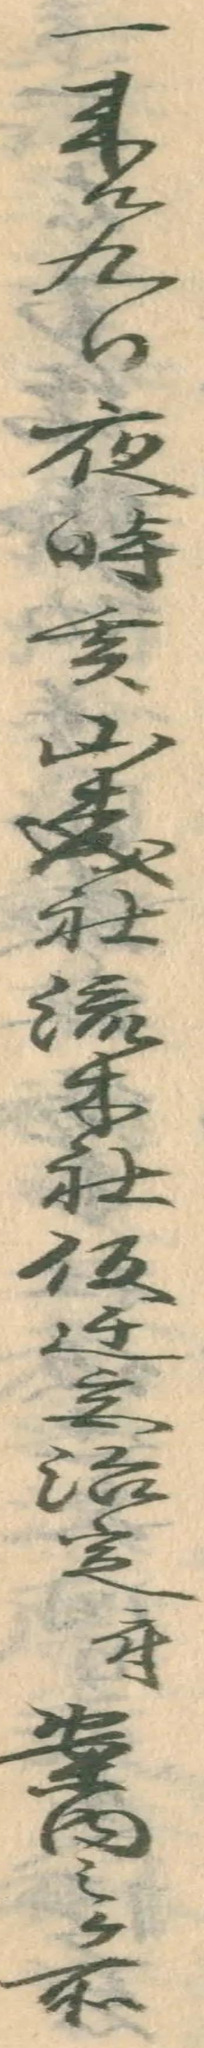一来ル九日夜時亥山森社流木社仮迁宮治定ニ付案内之ケ所

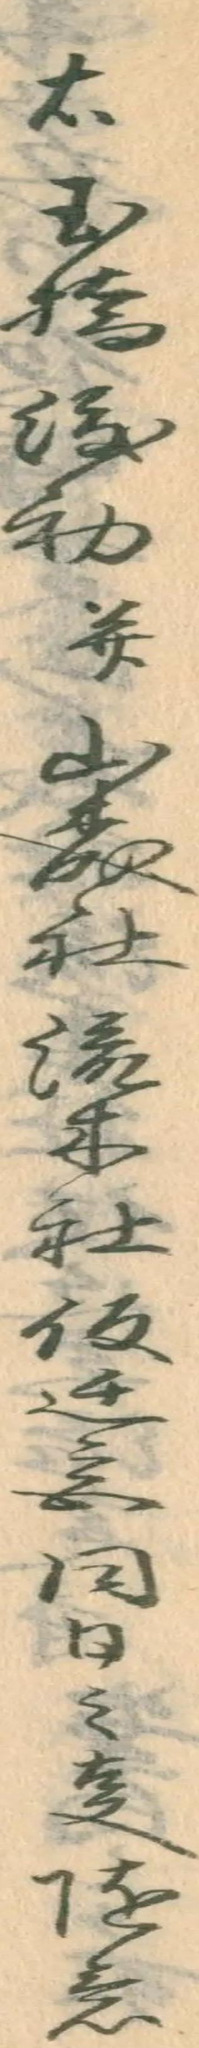一右玉橋渡初并山森社流木社仮迁宮同日之事随意
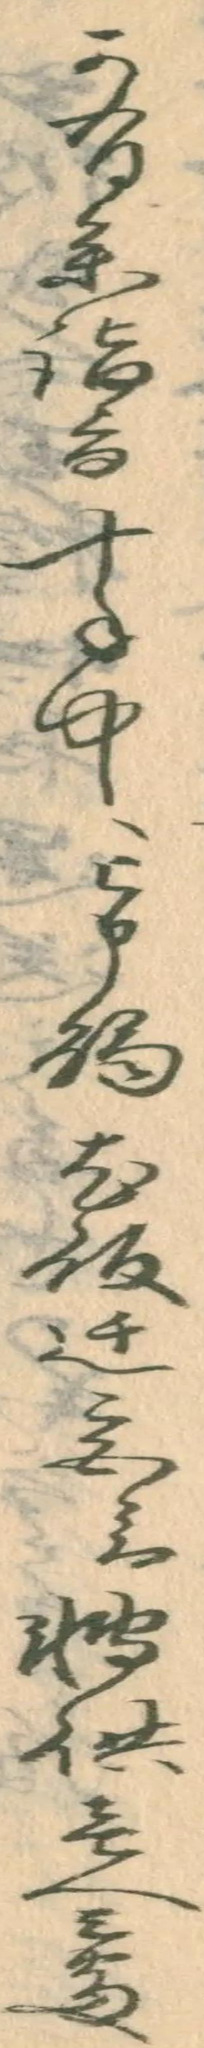可有参詣旨十手中へ被申触尤仮迁宮ニ而転供壱人三番
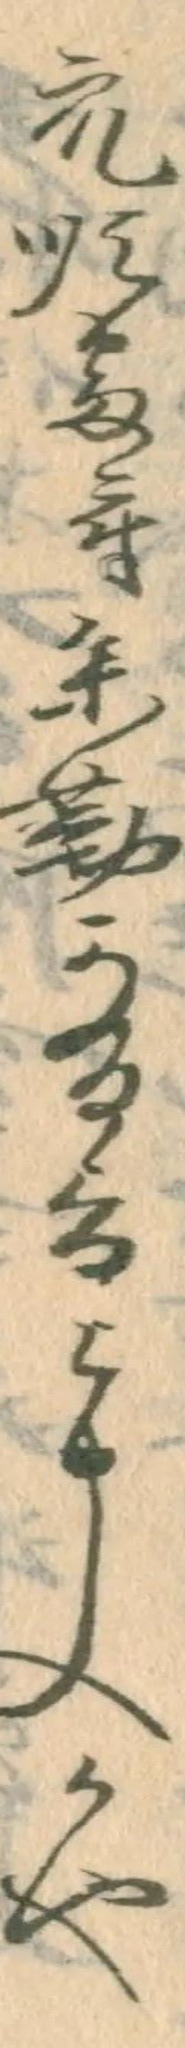衆順番ニ付参勤可有旨被申入候也
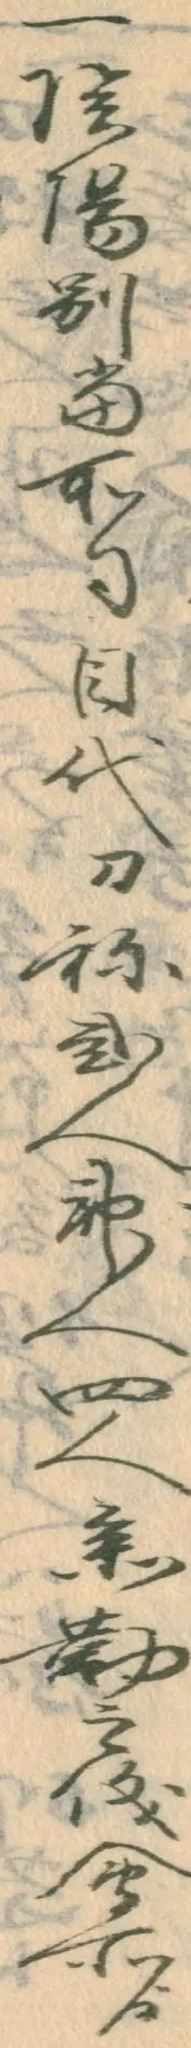一陰陽別当所司目代刀祢弐人神人四人参勤之儀会所ゟ
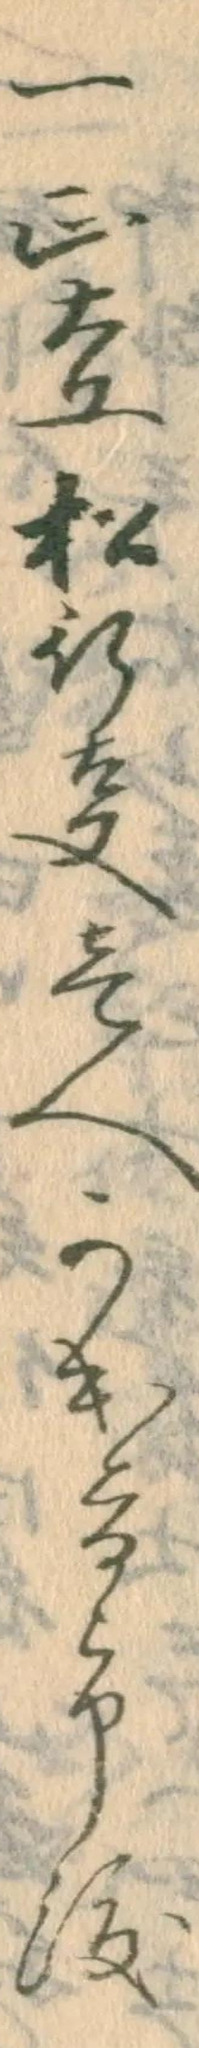一正大工松行事壱人可出旨被申渡
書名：賀茂社記録. 第17冊
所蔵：国立国会図書館 National Diet Library, JAPAN
